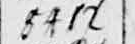5412
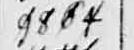9864
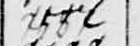2552
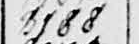3188
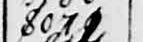8072
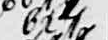627
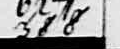388
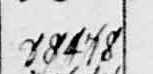38478
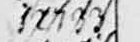12733
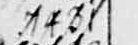7431
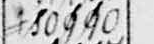15099
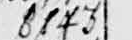6143
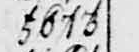5673
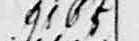9165
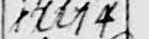12274
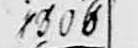1306
